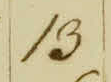13
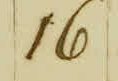16
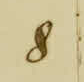8
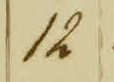12
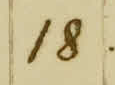18
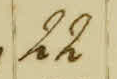22
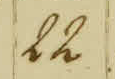22
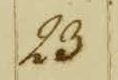23
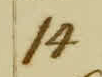14
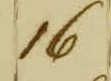16
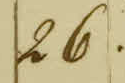26
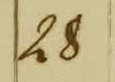28
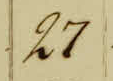27
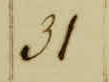31
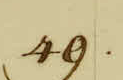49
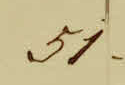51
